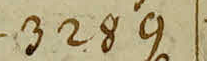3289
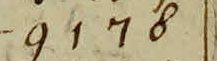9178
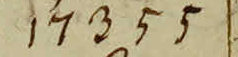17355
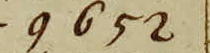9652
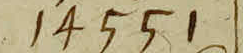14551
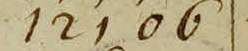12106
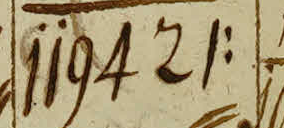119421:
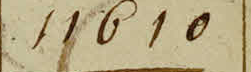11610
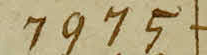7975
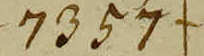7357
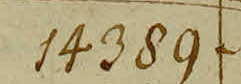14389
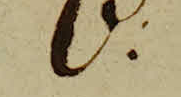6:
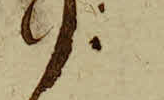9:
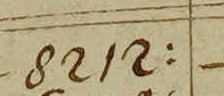8212:
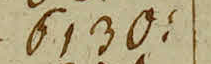6130:
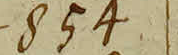854
